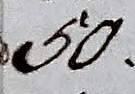50
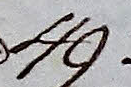49
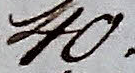40
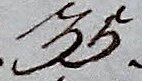35
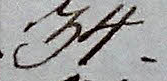34
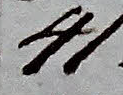41
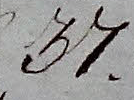37
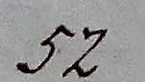52
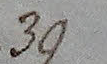39
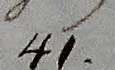41
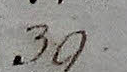39
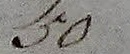50
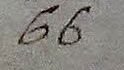66
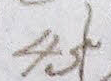45
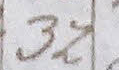32
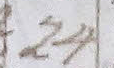24
